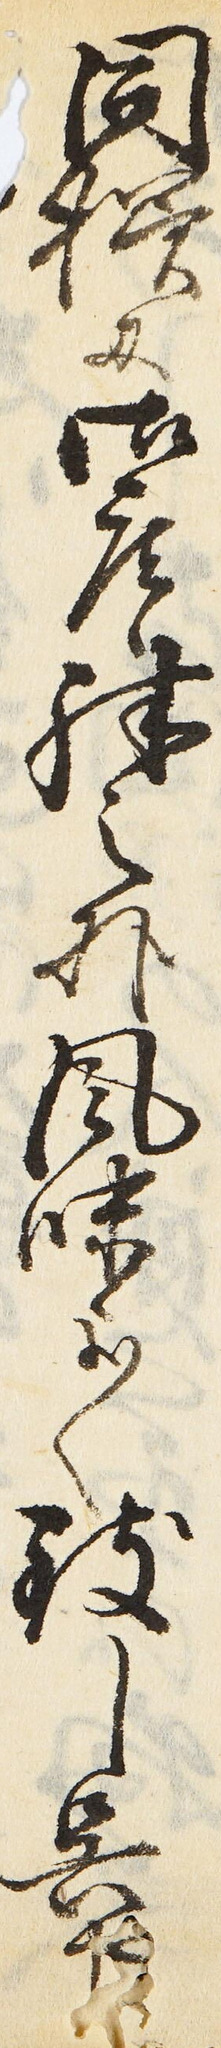同様に御座候殊之外風味よく致し呉
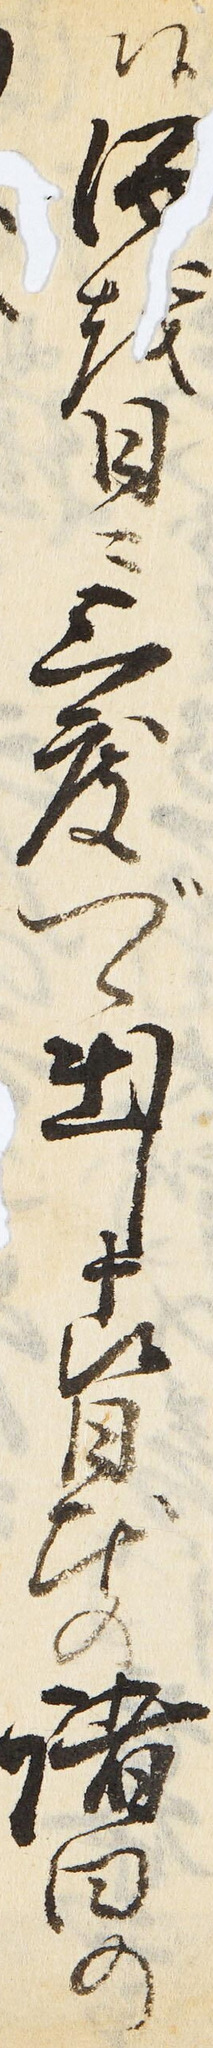候酒を日ニ三度づゝ出し申候日本の諸白の
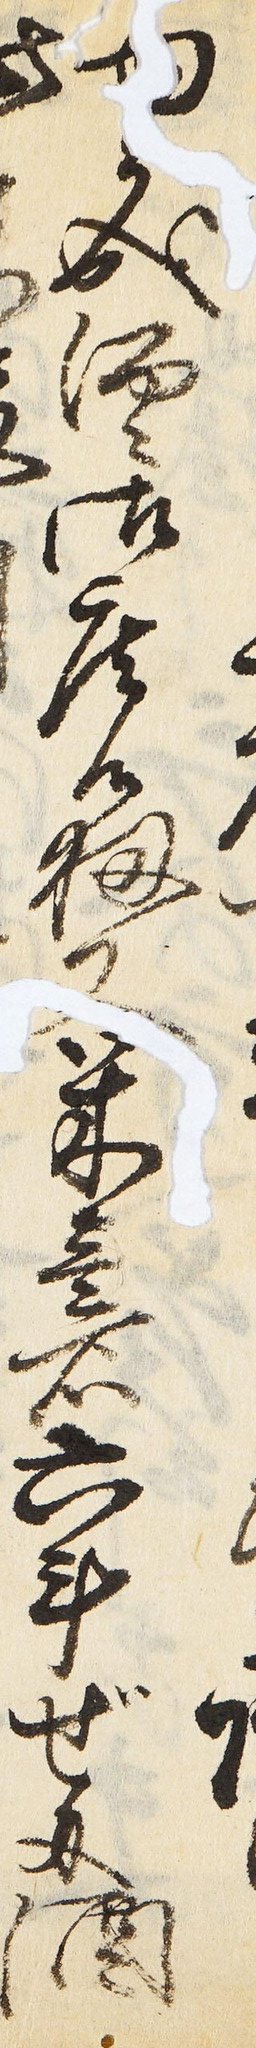やう成酒ニ御座候扨又米壱石六斗ぜに酒
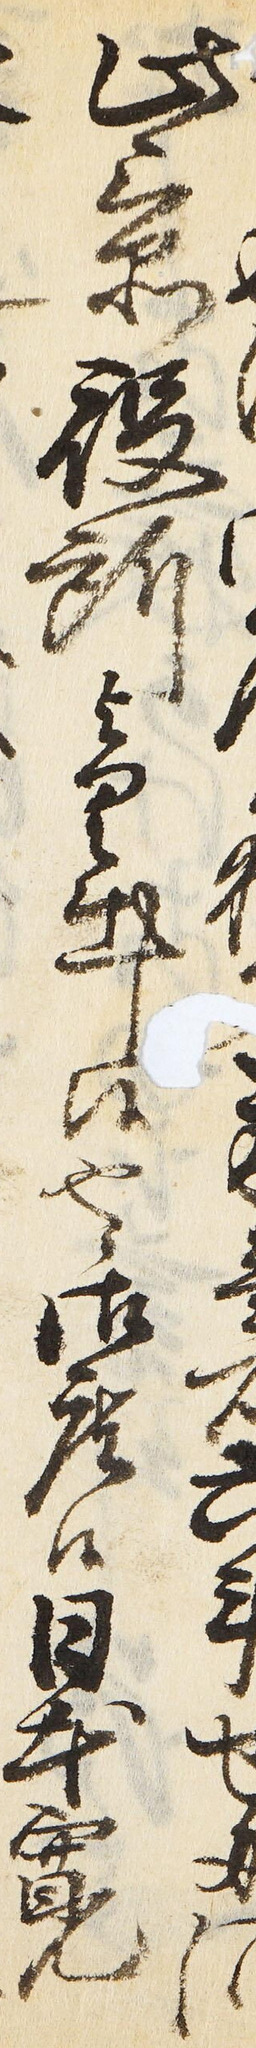此上品役所より出し候やう御座候日本寛
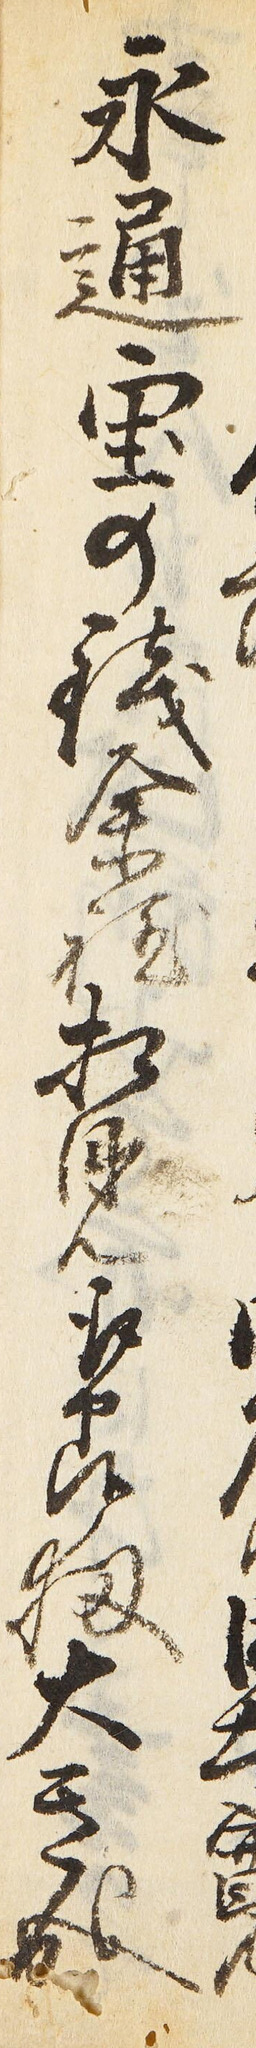永通宝の銭余程相見江申候扨大き成
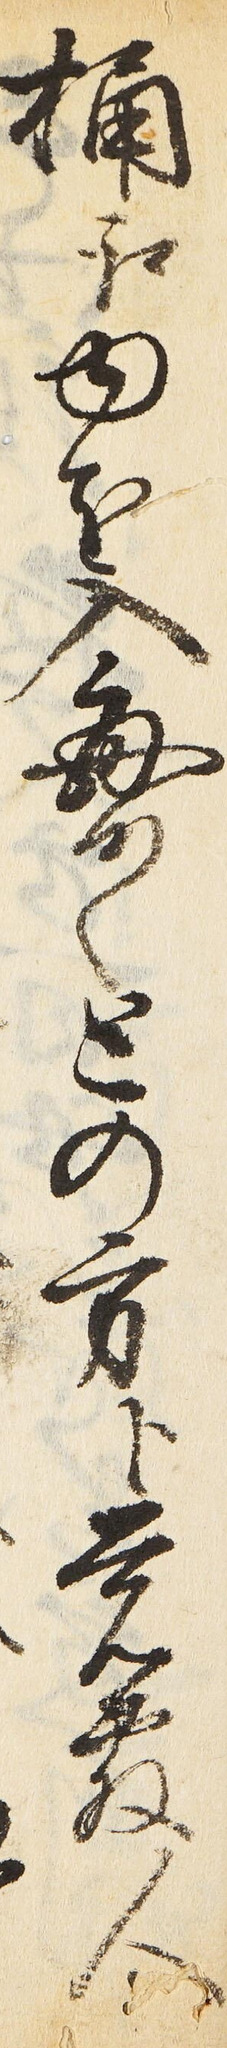桶江ゆを入毎日〳〵との方ト覚敷人
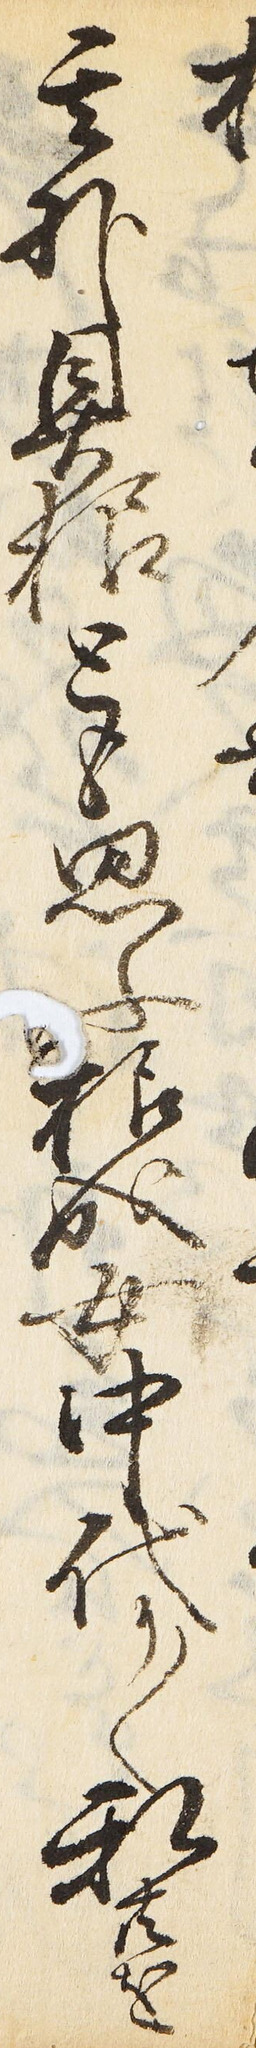其外奥様とも思ふ様成女中代り〳〵私共を
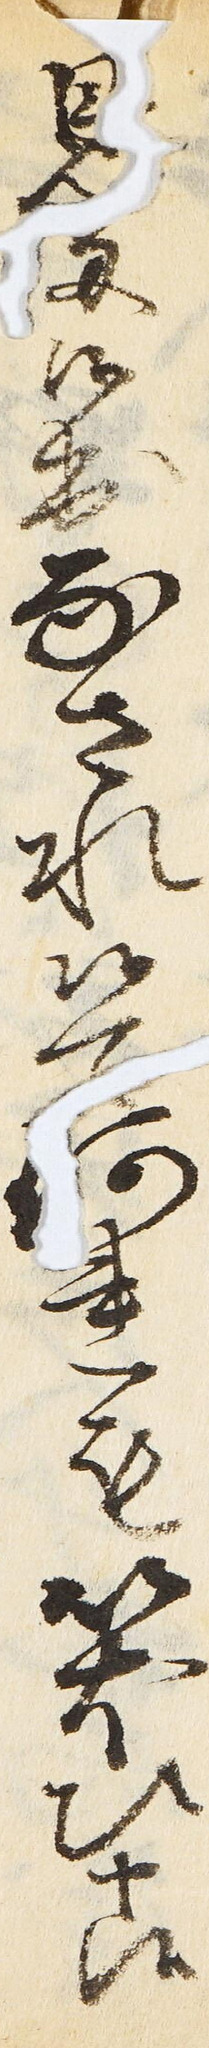見物御出なされ候て何れも笑ひ申候
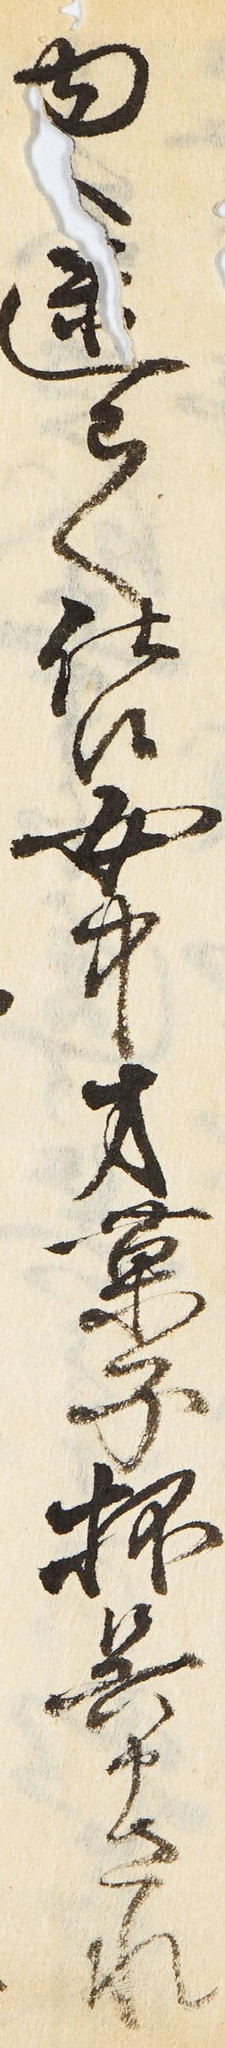ゆへ迷わく仕候女中方菓子抔呉申され
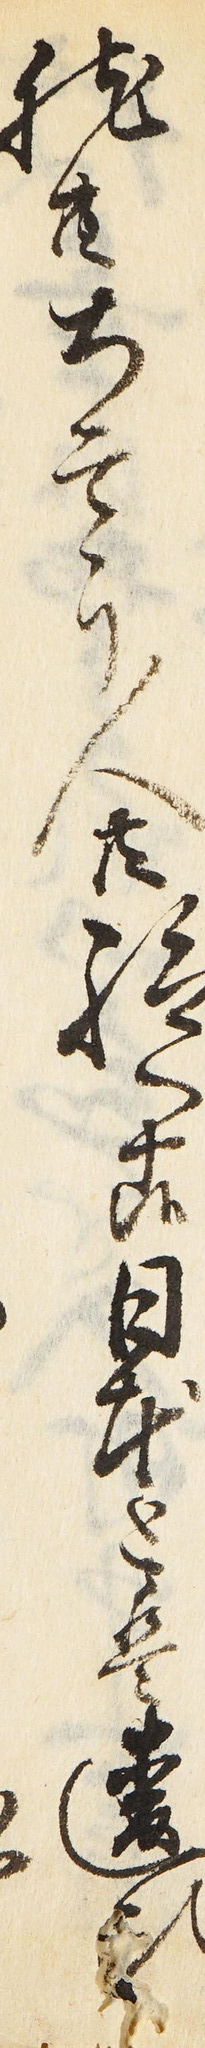然共ちそう人共給へ申候日本とは違ひ
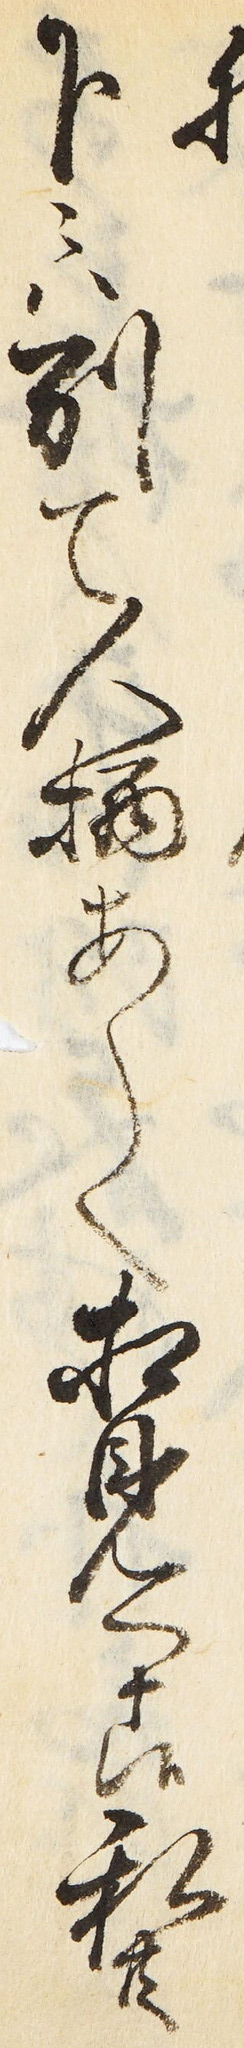下ニハ別て人柄あしく相見へ申候私共
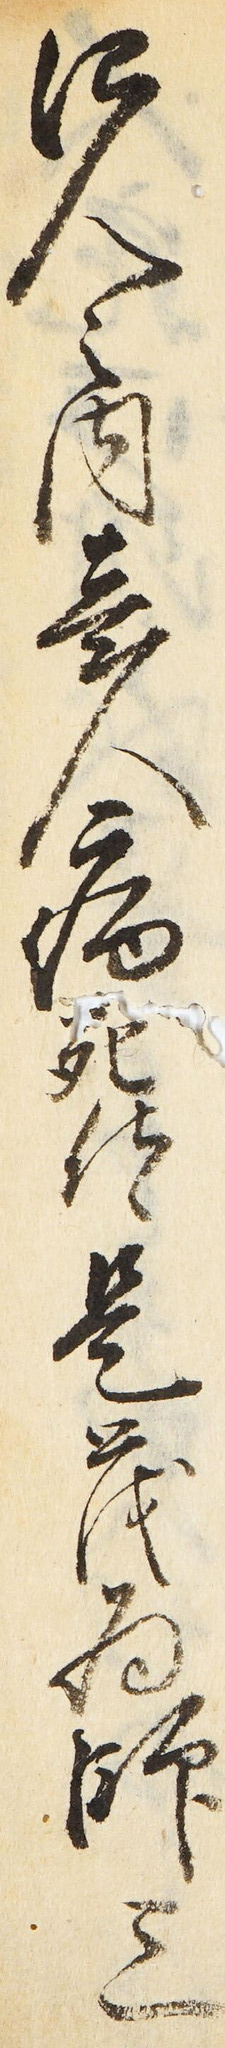四人之中壱人病死仕候是茂為師三

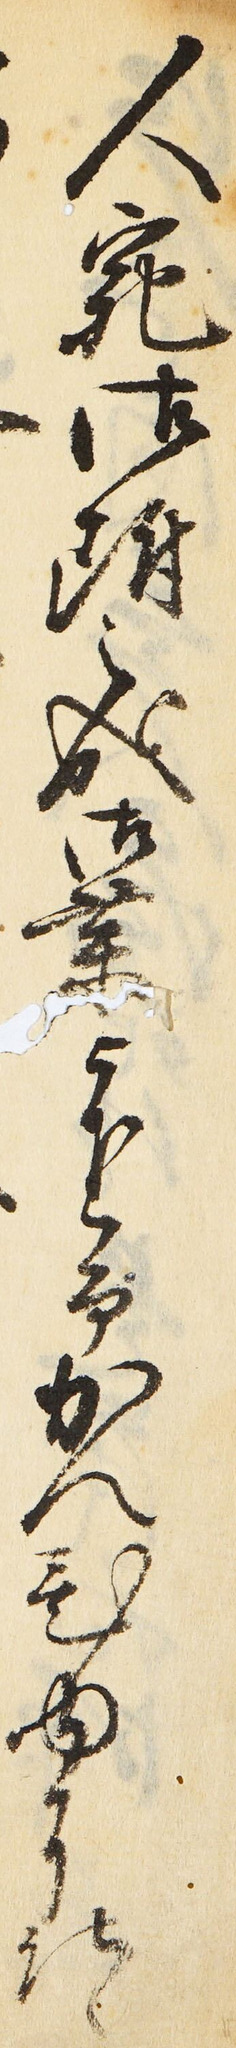人宛御附被成御薬被下候而かんひゆう仕候
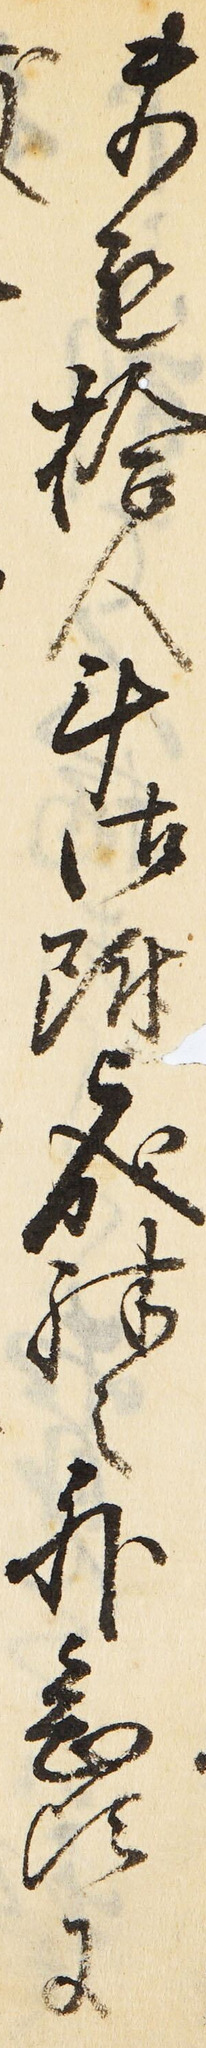夫も拾人計御附被成殊之外念頃に
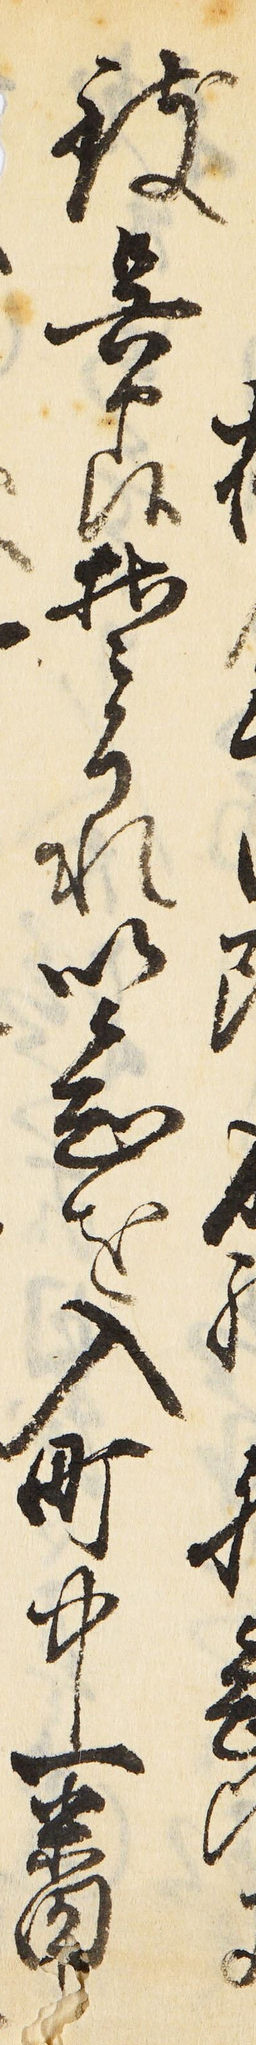致呉申候そうれい念を入町中一番
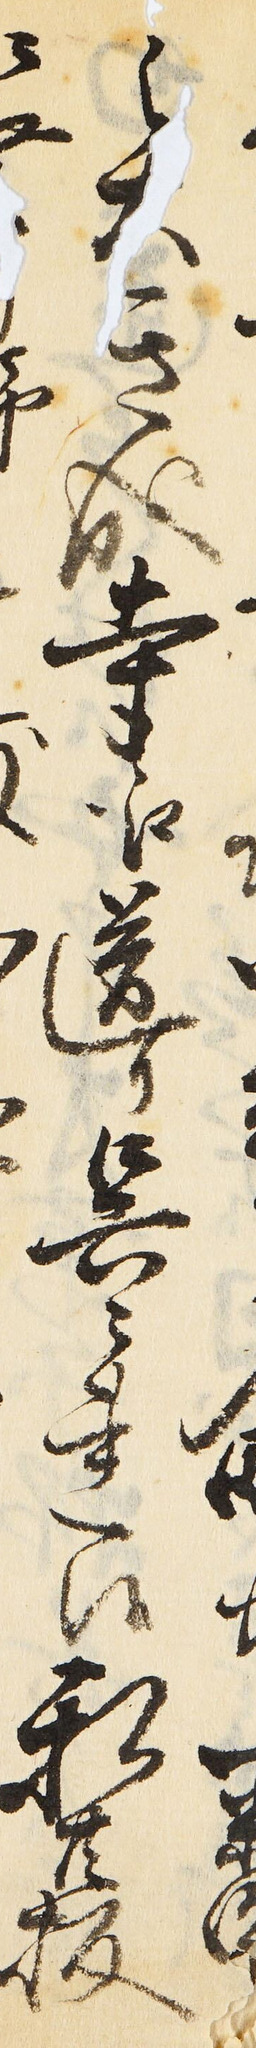之大き成寺江送り呉れ候私共板
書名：志州鳥羽船頭外国江吹流し候一件
